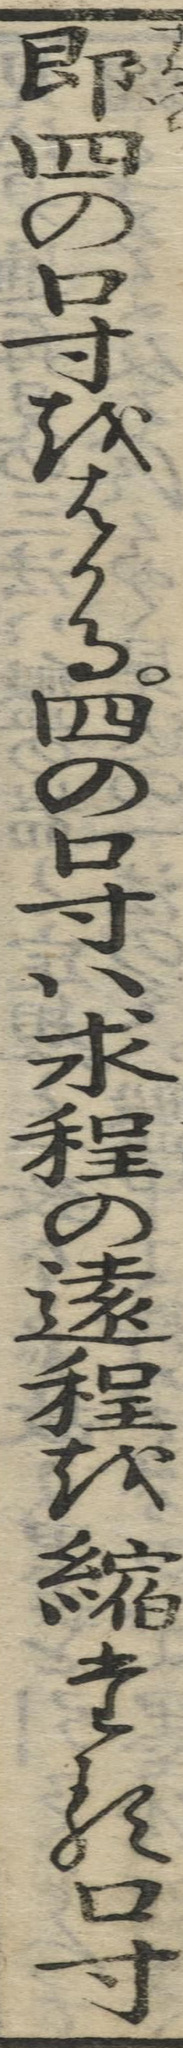即四の口寸をはかる。四の口寸は求程の遠程を縮たる口寸
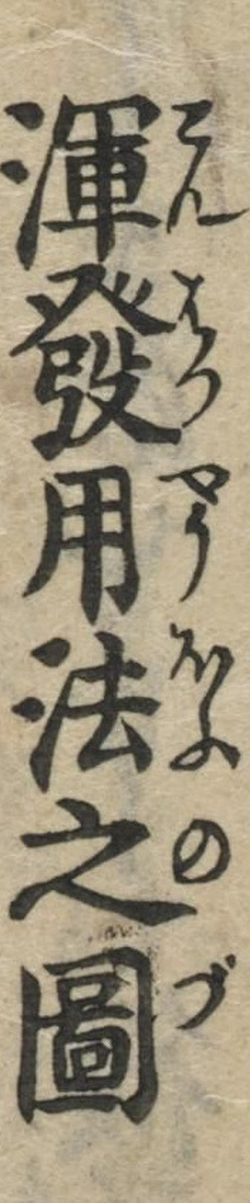渾発用法之図
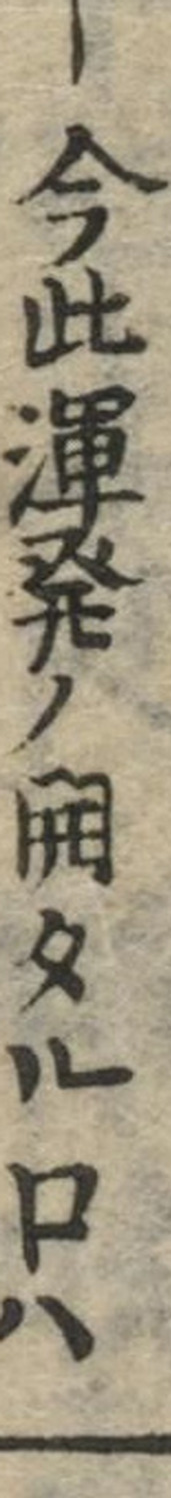今此渾発ノ開タル口ハ
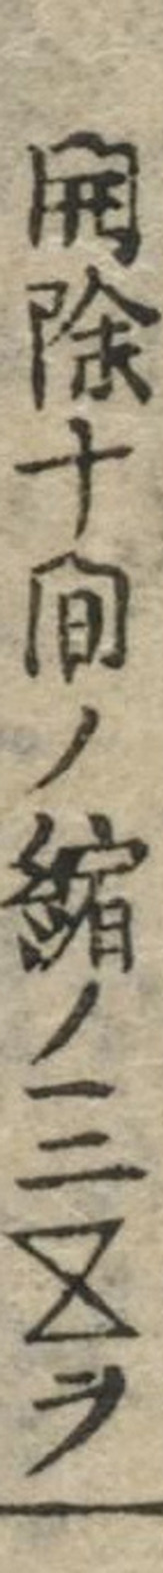開除十間ノ縮ノ三▽△ヲ
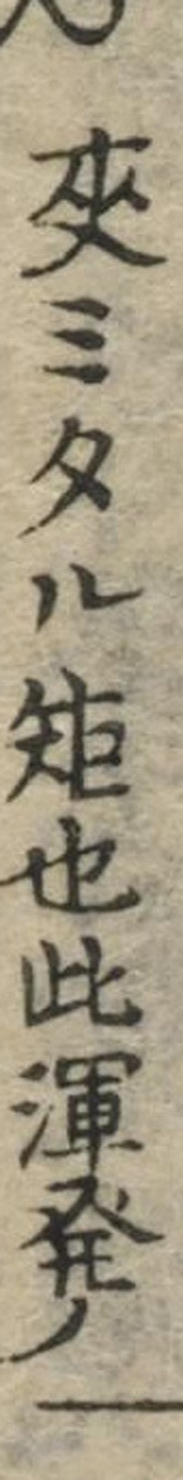夾ミタル矩也此渾発ノ
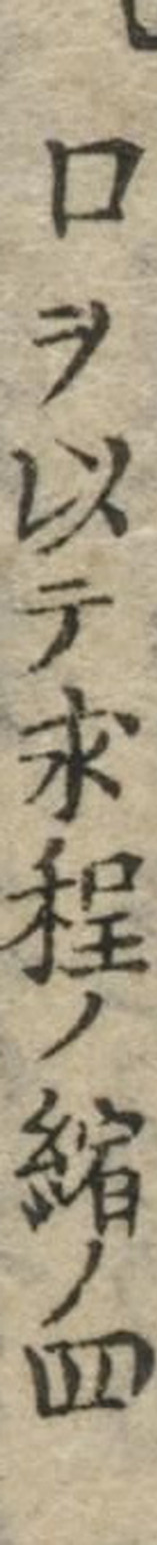口ヲ以テ求程ノ縮ノ四
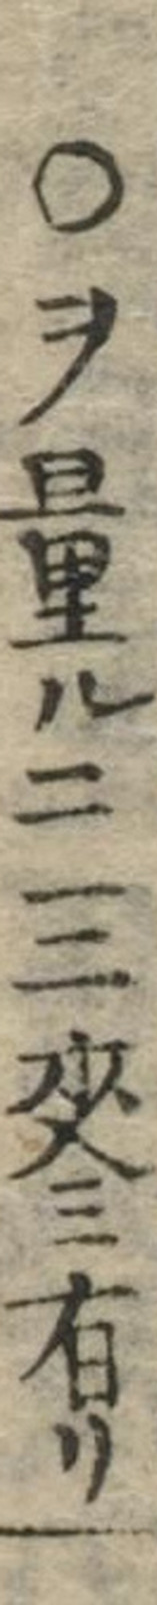○ヲ量ルニ三夾ミ有リ
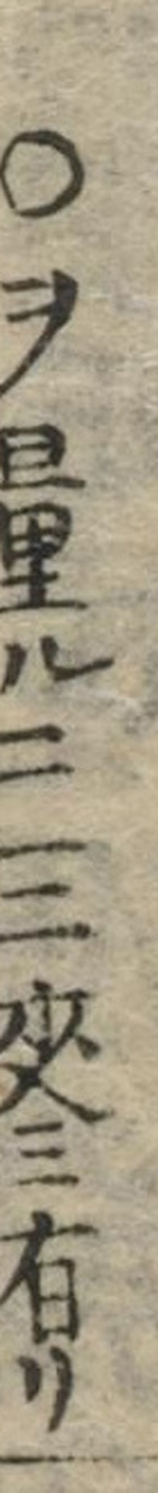○ヲ量ルニ三夾ミ有リ
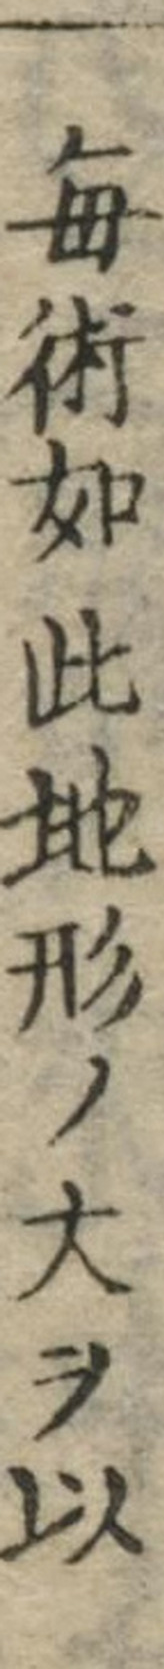毎術如此地形ノ大ヲ以
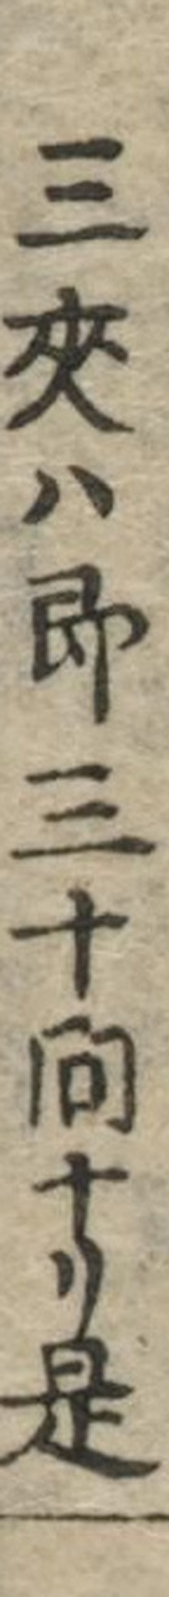三夾ハ即三十間ナリ是
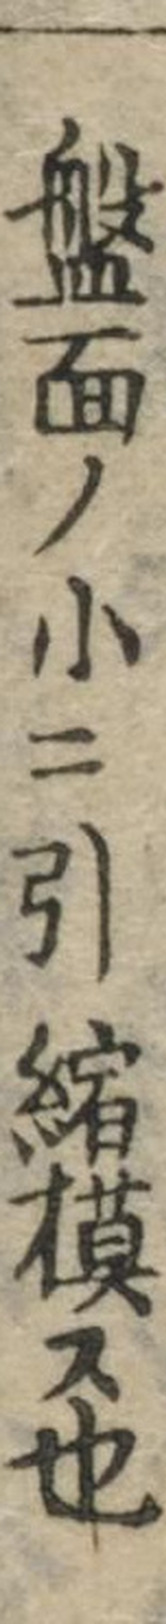盤面ノ小ニ引縮模ス也
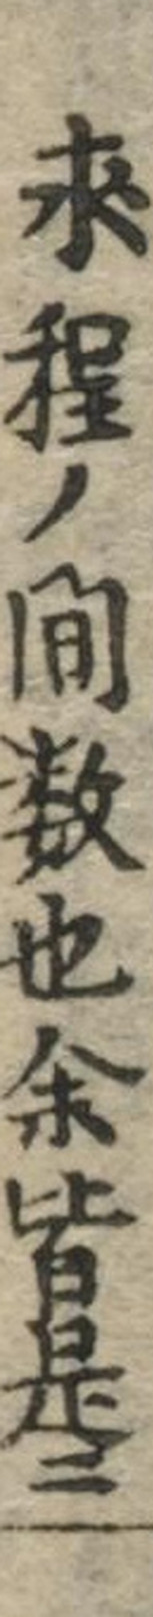求程ノ間数也余皆是ニ
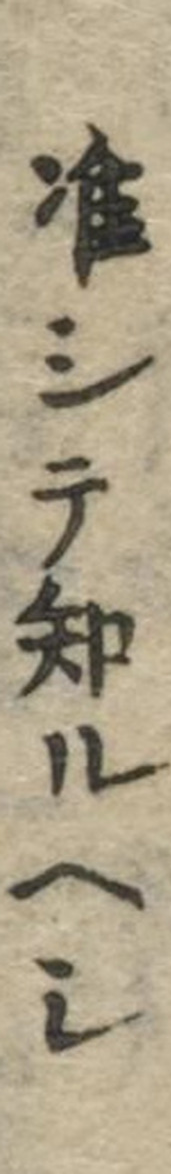准シテ知ルヘシ
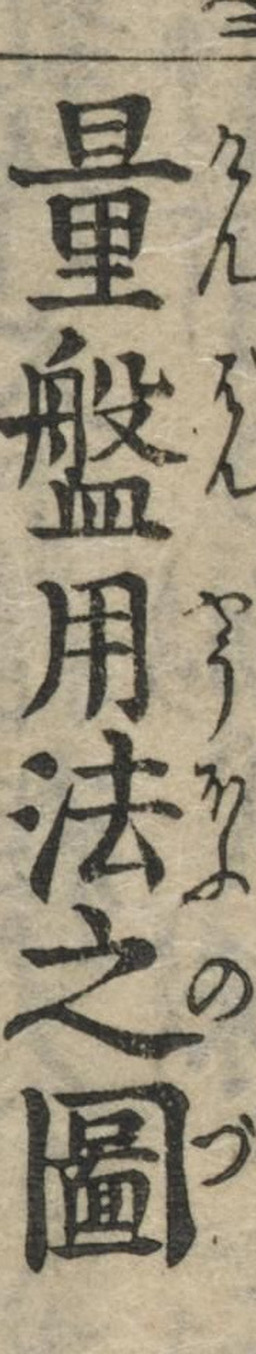量盤用法之図
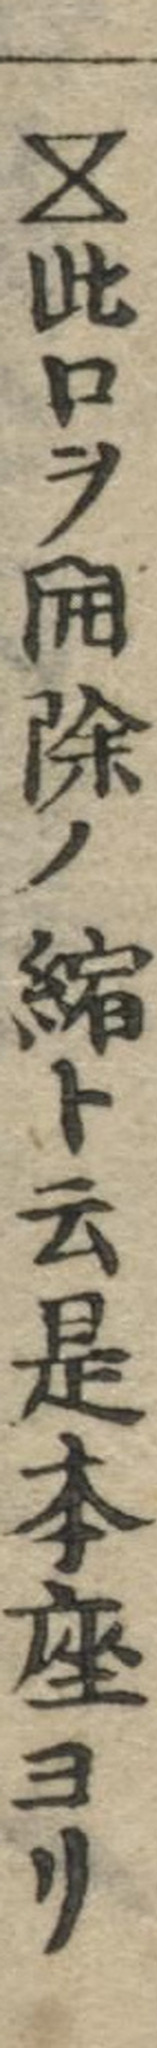▽△此口ヲ開除ノ縮ト云是本座ヨリ
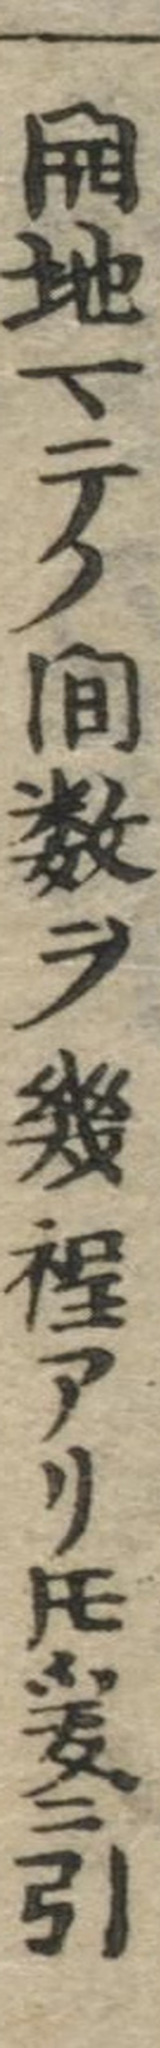開地マテノ間数ヲ幾程アリトモ爰ニ引
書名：量地指南　巻之一（内題）
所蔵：東京大学地震研究所図書室 Earthquake Research Institute Library, The University of Tokyo, JAPAN
